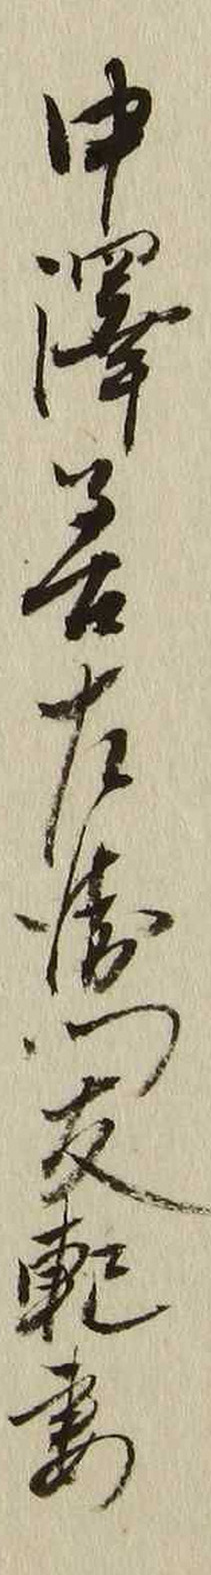女中沢善左衛門友範妻
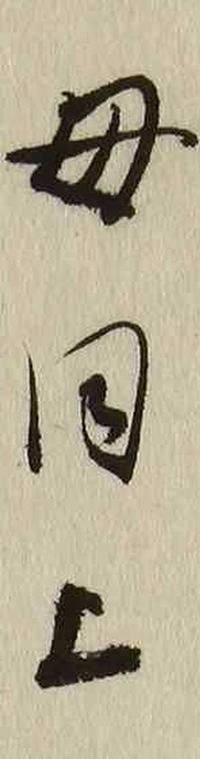母同上
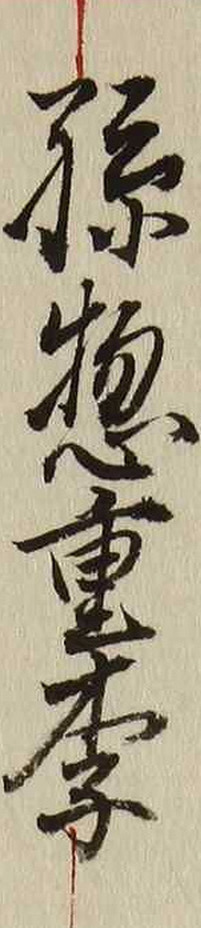孫惣重李
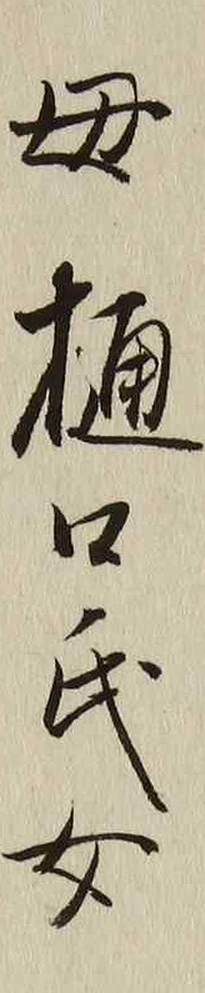母樋口氏女
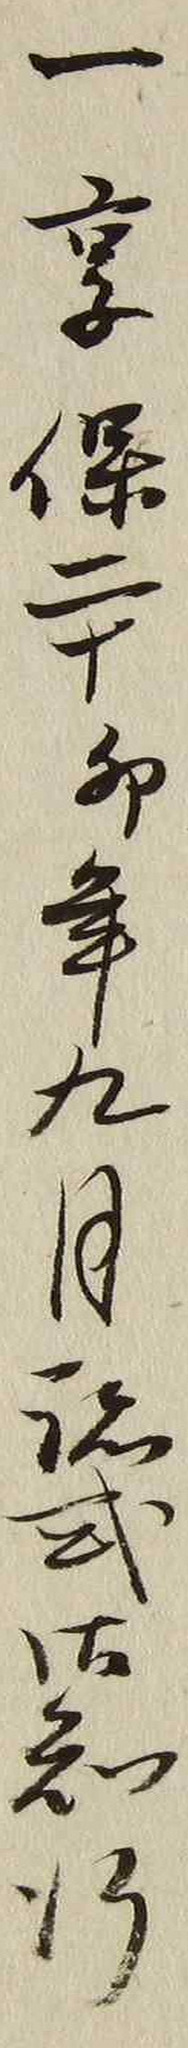一享保二十卯年九月跡式御知行
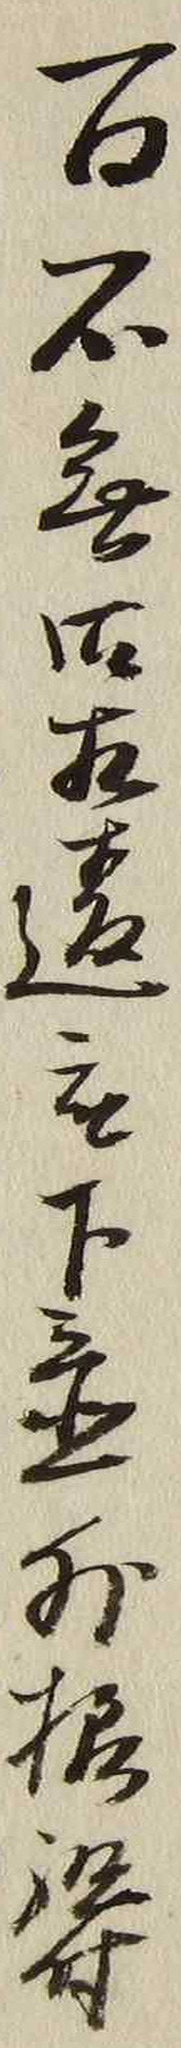百石無御相違被下置外様組付
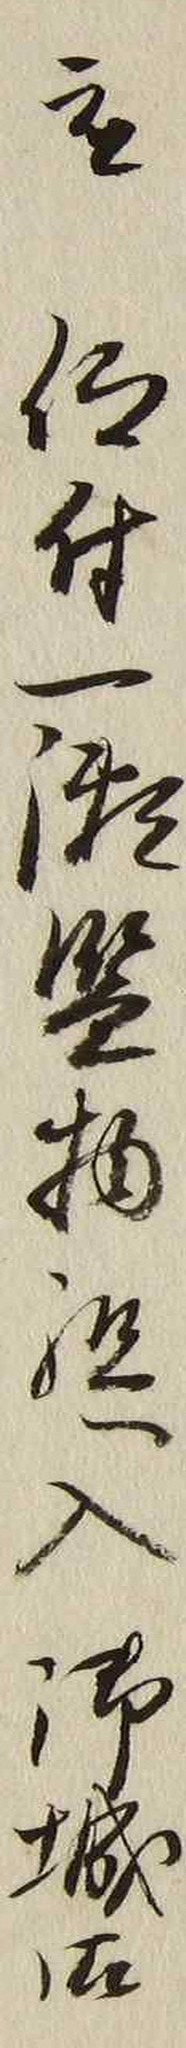被仰付一瀬監物組へ入御城御
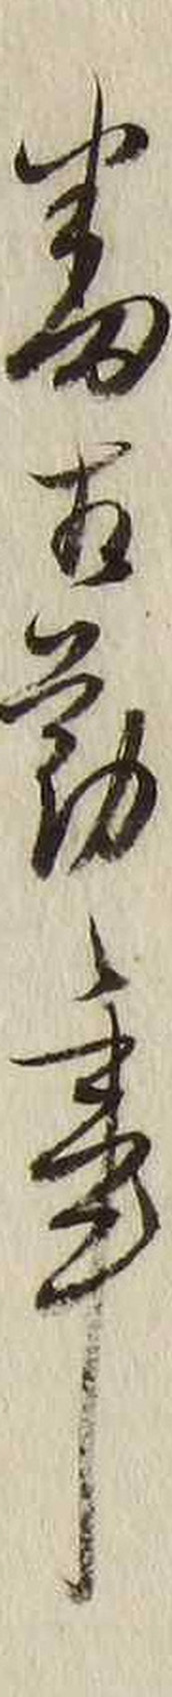番相勤候事
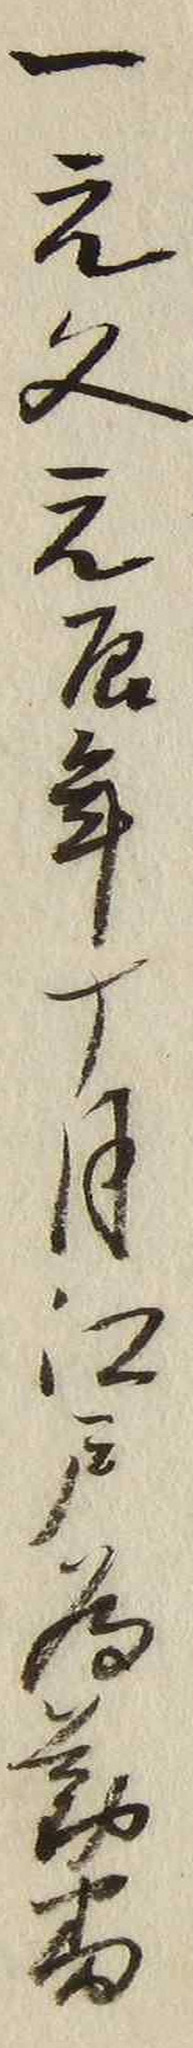一元文元辰年十月江戸為勤番

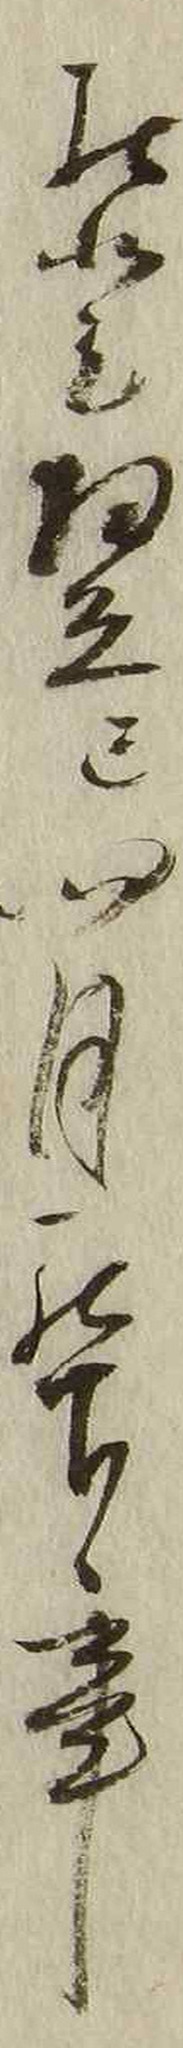罷登翌巳四月罷下候事
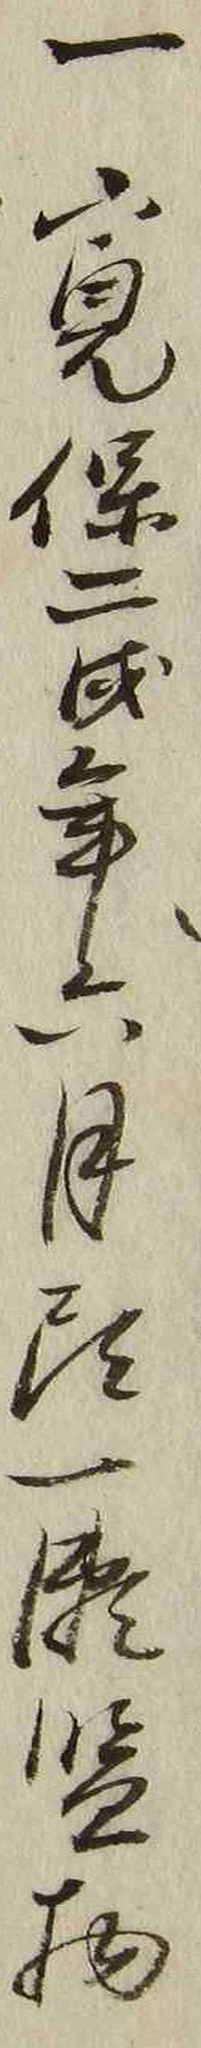一寛保二戌年六月頭一瀬監物
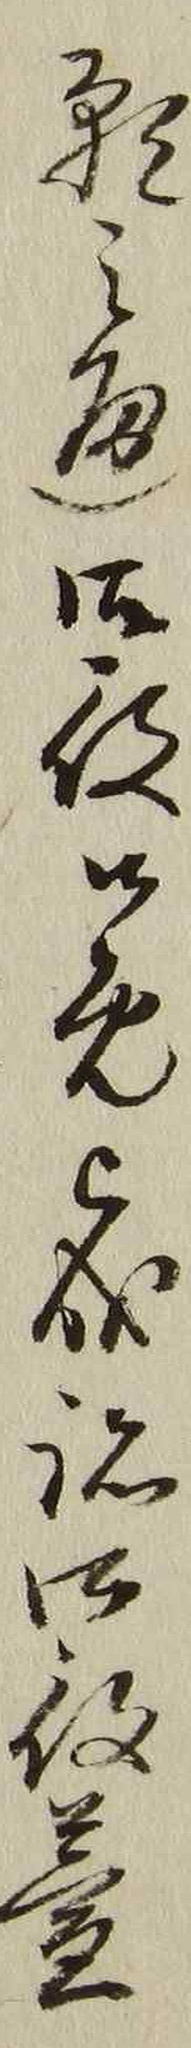願之通御役御免被成跡御役萱
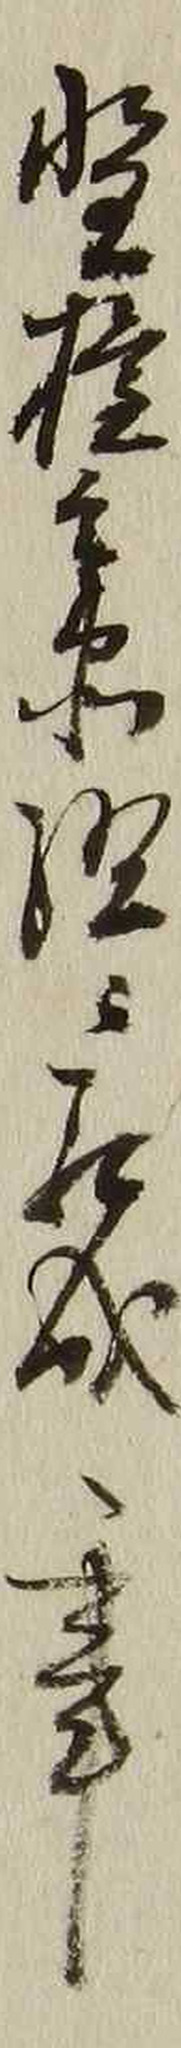野権兵衛組ニ罷成候事
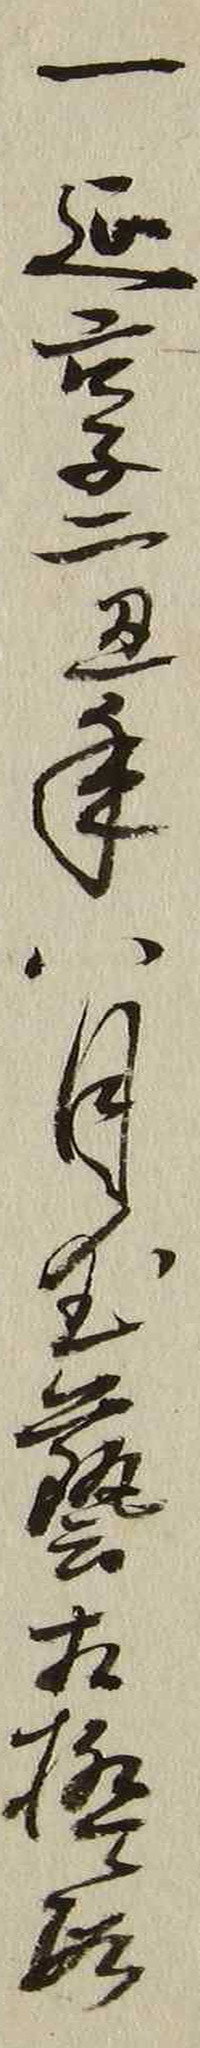一延享二丑年八月武芸相極候段
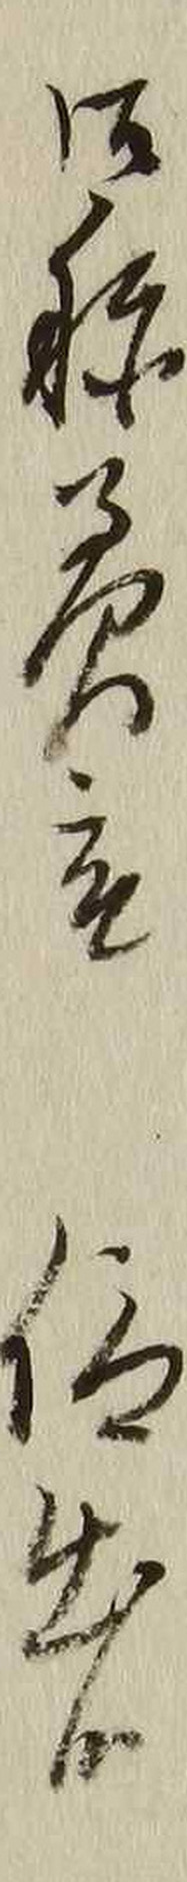御称美被仰出候
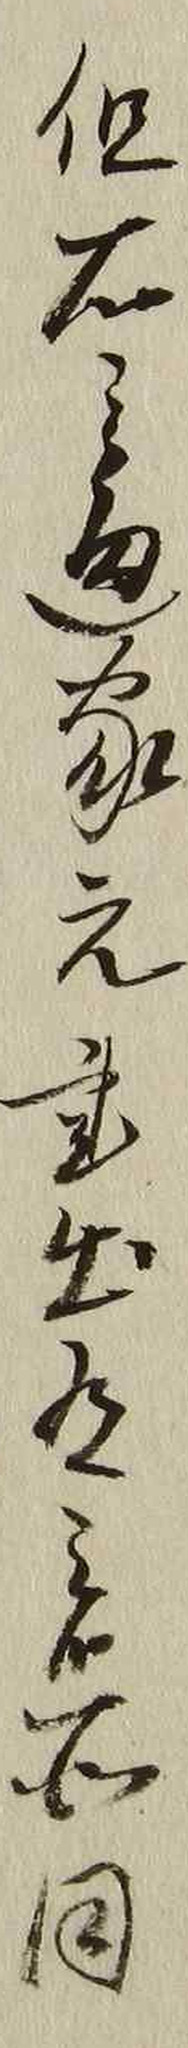但右之通家元書出有之候所同
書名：諸士系譜　巻之352　す之部2
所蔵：会津若松市立会津図書館
